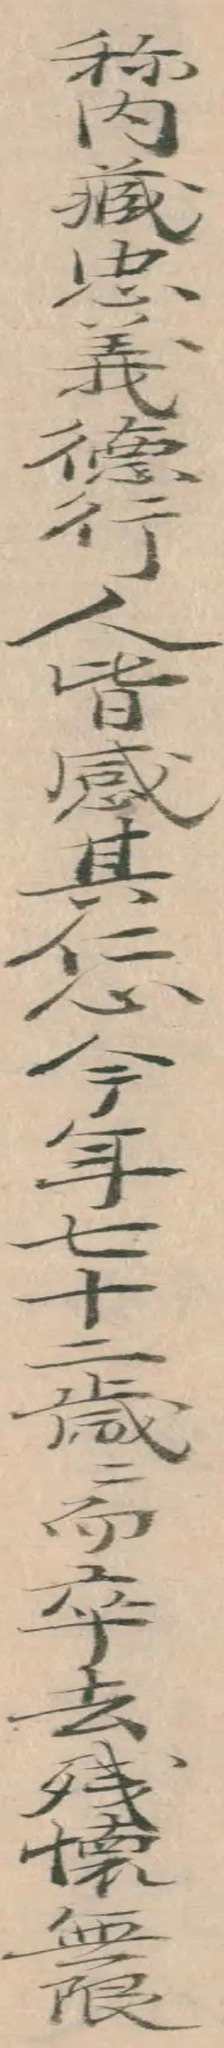称内蔵忠義徳行人皆感其仁心今年七十二歳ニ而卒去残懐無限
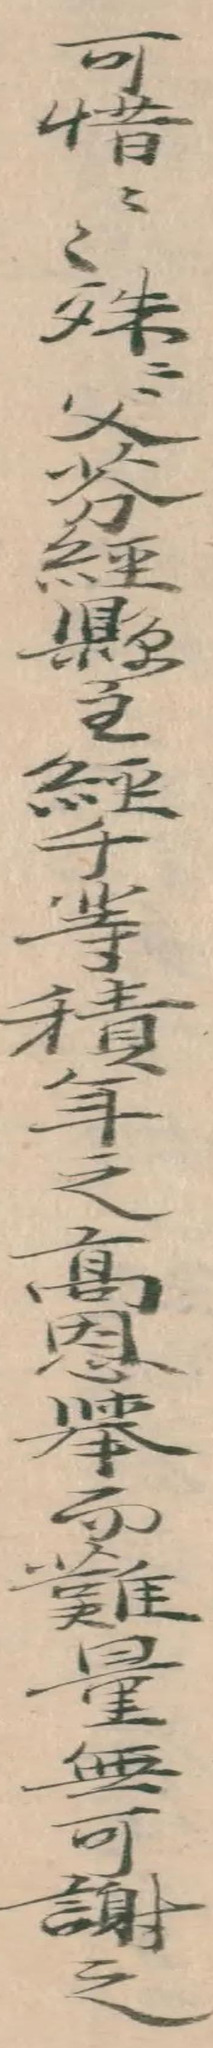可惜々々殊ニ父芩経縣王経千等積年之高恩擧而難量無可謝之
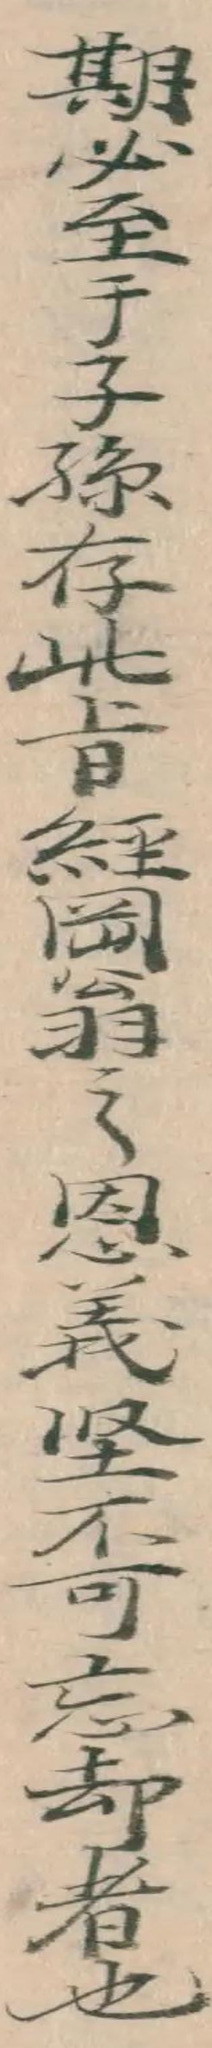期必至于子孫存此旨経岡翁之恩義堅不可忘却者也
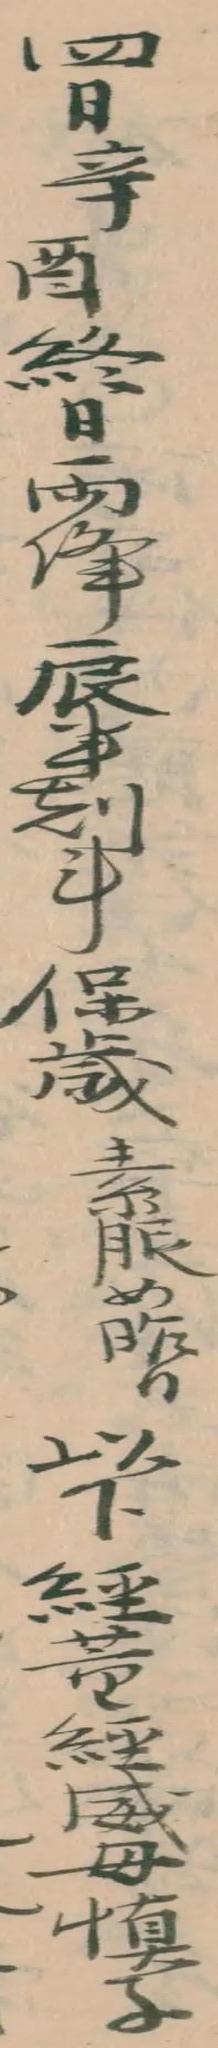四日辛酉終日雨降辰半刻斗保歳素服如昨日以下経董経威母慎子
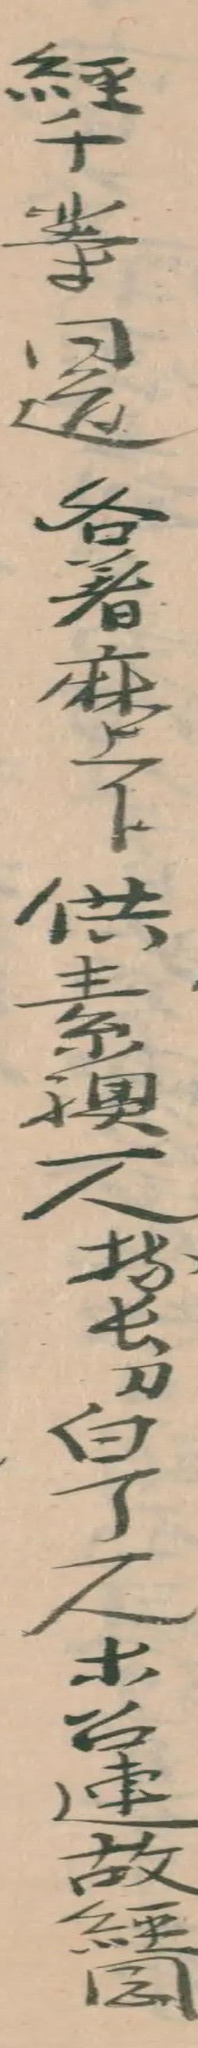経干等同道各着麻上下供素襖一人持長刀白丁一人等召連故経岡
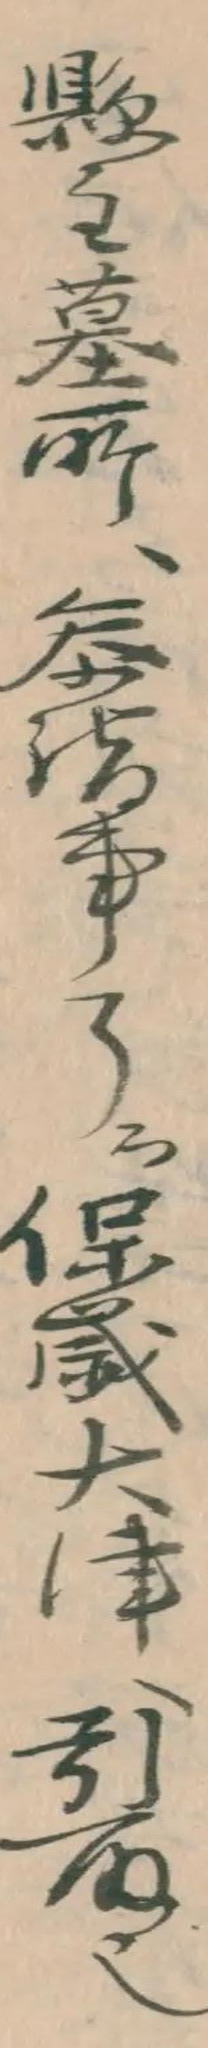縣主墓所へ参詣事了而保歳大津へ引取也
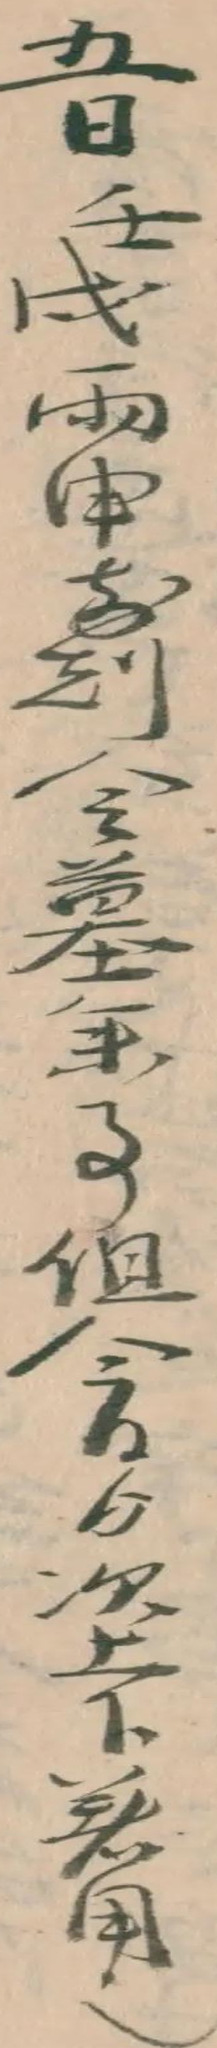五日壬戌雨申前刻令墓参之事但今日ゟ次上下着用也
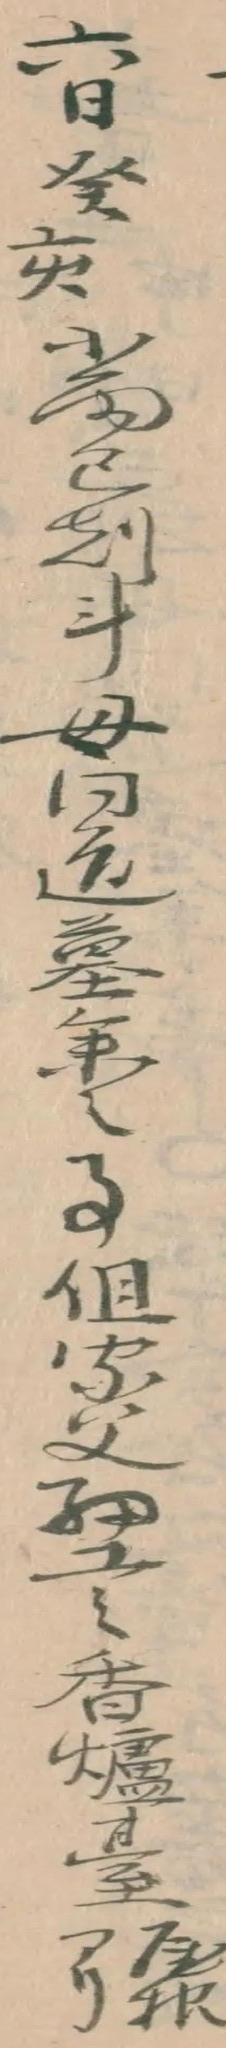六日癸亥小雨巳刻斗母同道墓参之事但家父初之香爐䑓屋根アリ
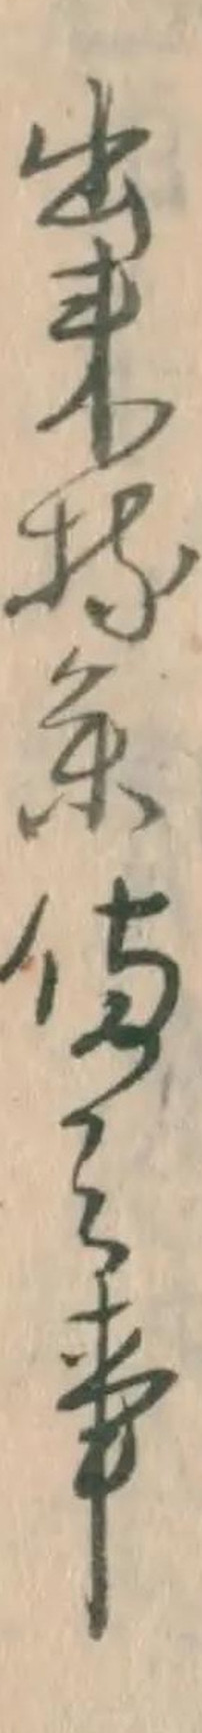出来持参備之事
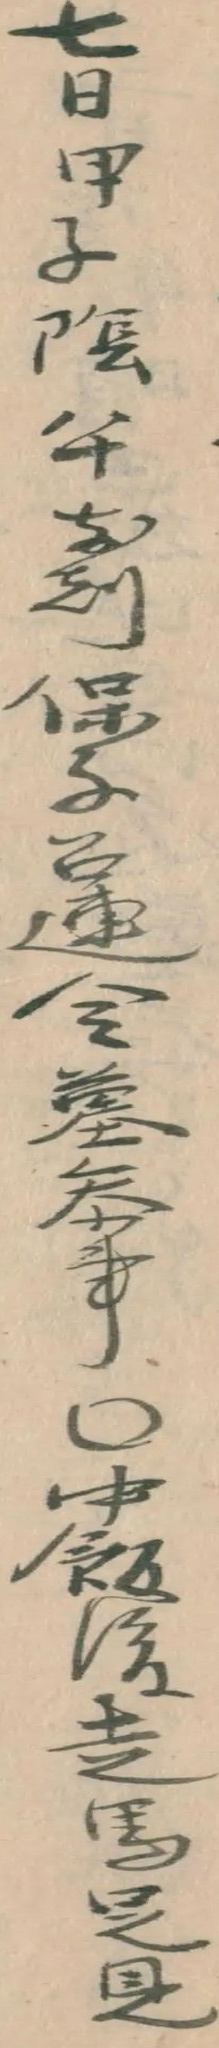七日甲子陰午前刻保子召連令墓参事〇中飯後走馬足見
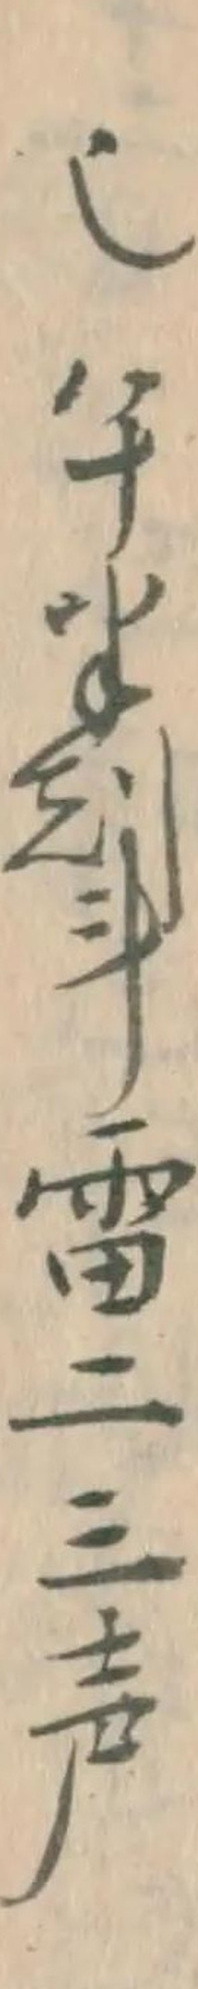也午半刻斗雷二三声
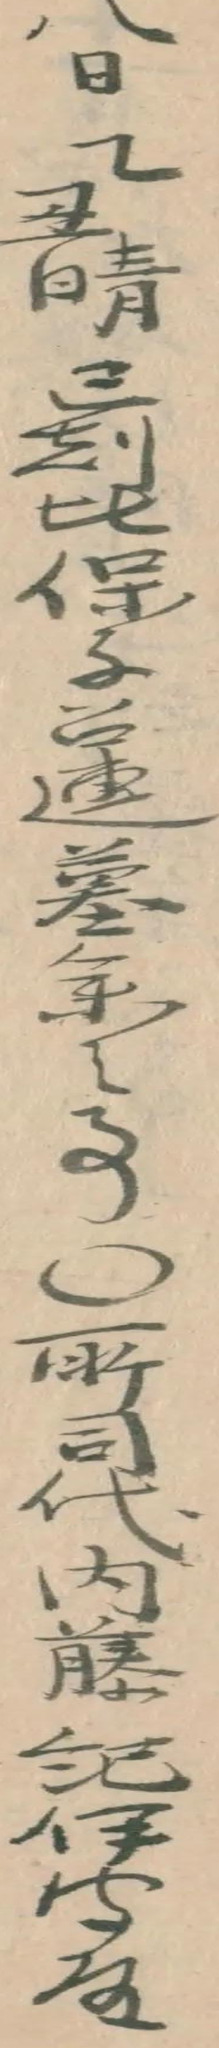八日乙丑晴巳刻比保子召連墓参参之事〇所司代内藤紀伊守殿
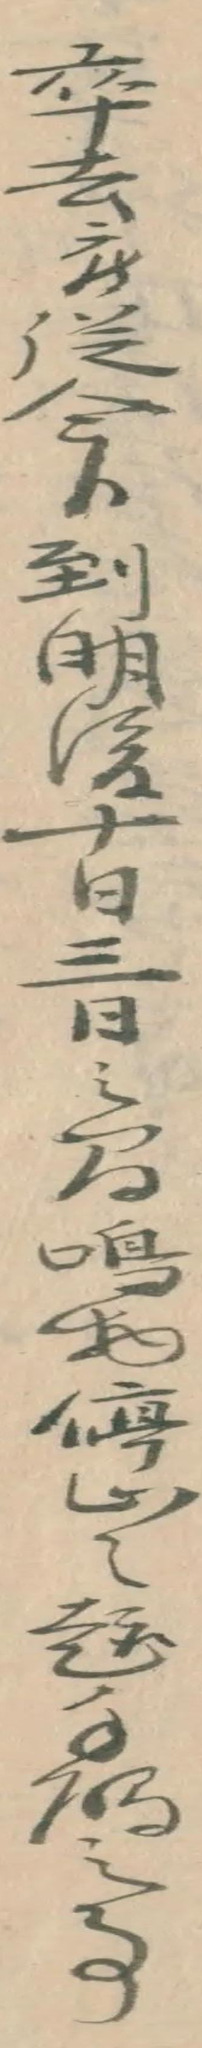卒去ニ付従今日到明後十日三日之間鳴物停止之趣手触之事
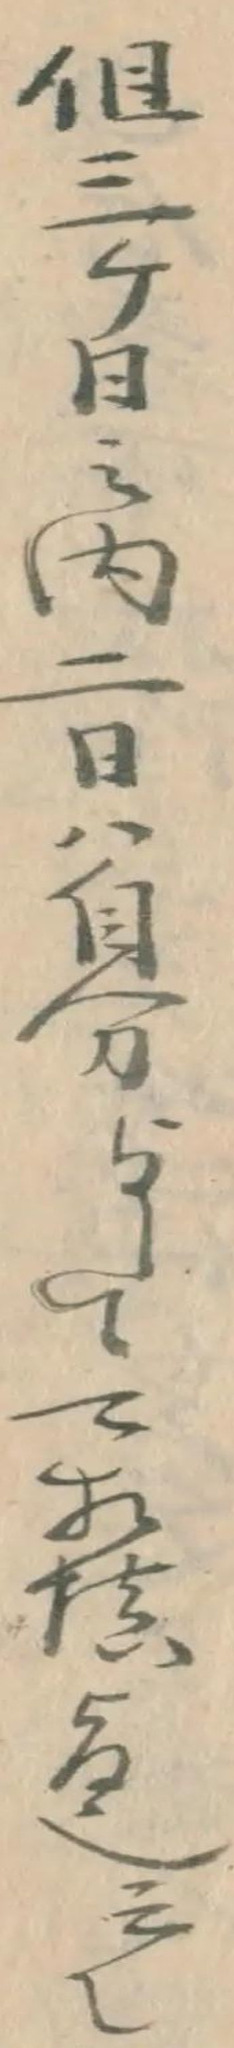但三ヶ日之内二日は自分として可相慎旨也云々
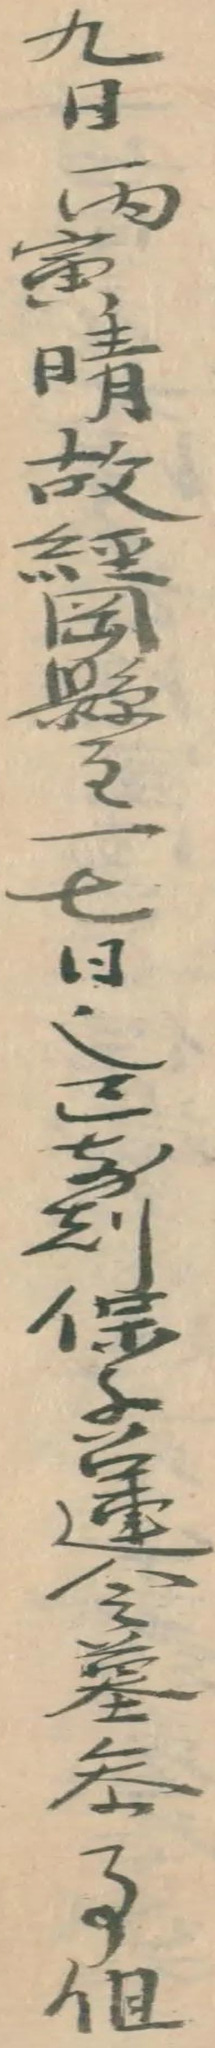九日丙寅晴故経岡県主一七日也巳前刻保子召連令墓参事但

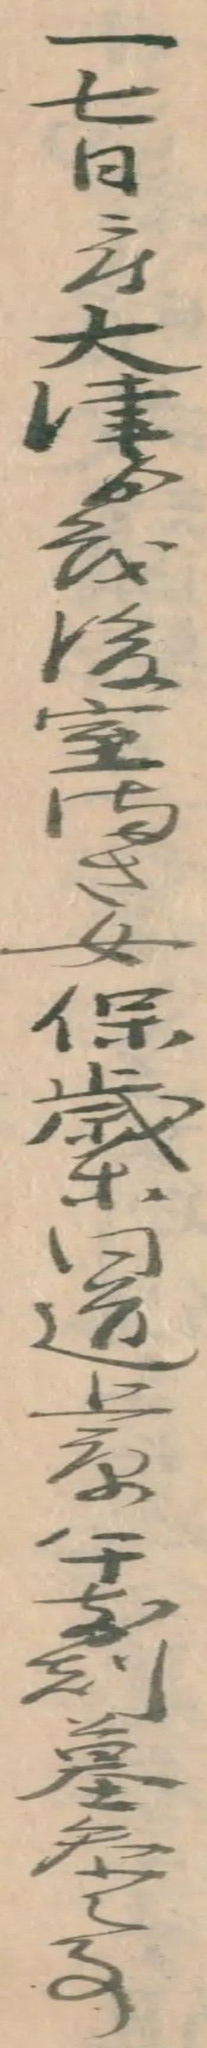一七日ニ付大津ゟも後室みさ女保歳等同道上京午前刻墓参之事
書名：賀茂社記録. 第65冊
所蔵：国立国会図書館 National Diet Library, JAPAN
